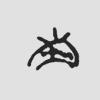{木土}
